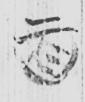百
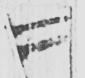二
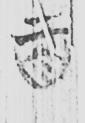百
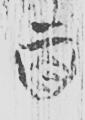百
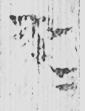九十=
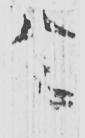八十=
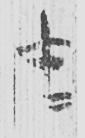七十=
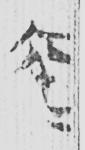六十=
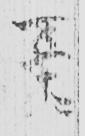五十=
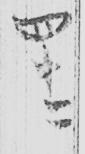四十=
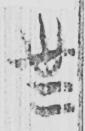卅=
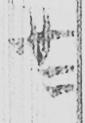廿=
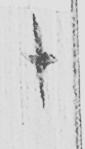十
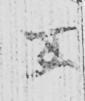五
